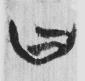曰
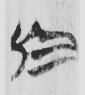於
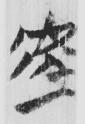𫊟
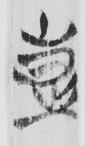彭
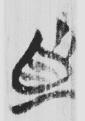且
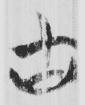古
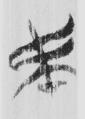民
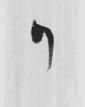人
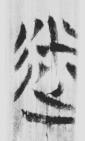迷
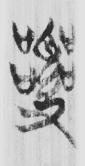{𤔔㗊}
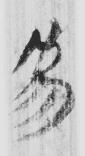象
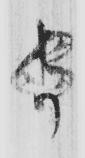矛
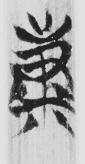康
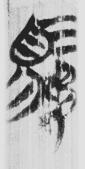{馬矛}
